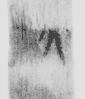六
